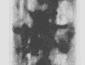亓
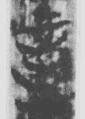意
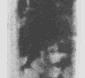於
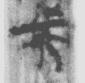天
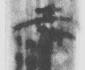下
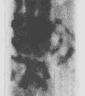則
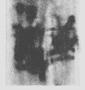或
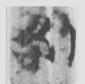咎
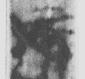天
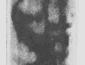曰
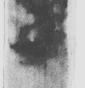母
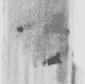乃
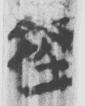𫊟
